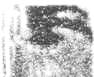不
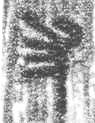求
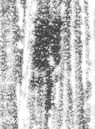則（則）
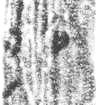子
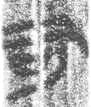可
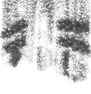行
